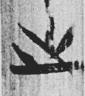之
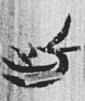此
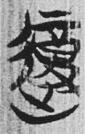○（復）
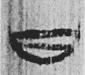甘
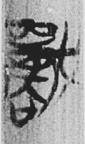○（戰）
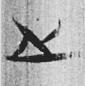之
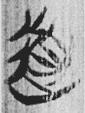道
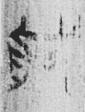戕（莊）
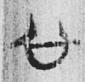公
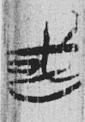或（又）
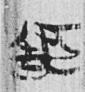䎽（聞）
